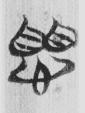{䀠心}
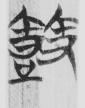鼓
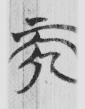而
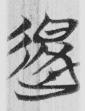退
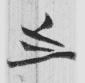之
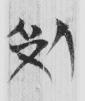死
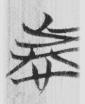者
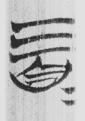{三自}=
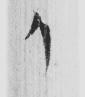人
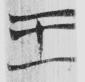王
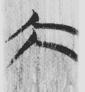大
